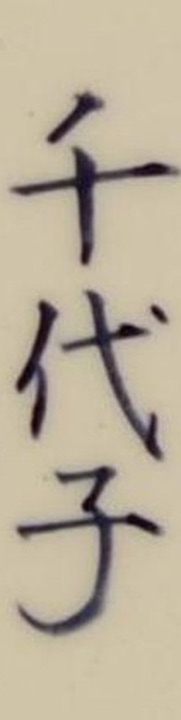千代子
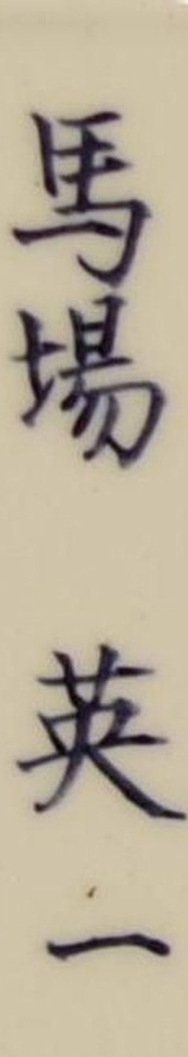馬場英一
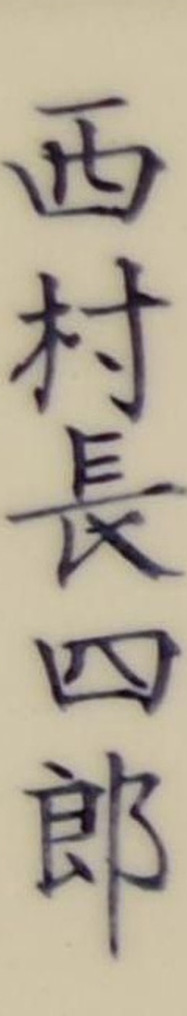西村長四郎

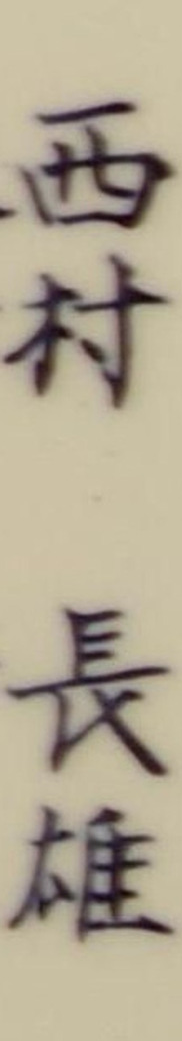西村長雄
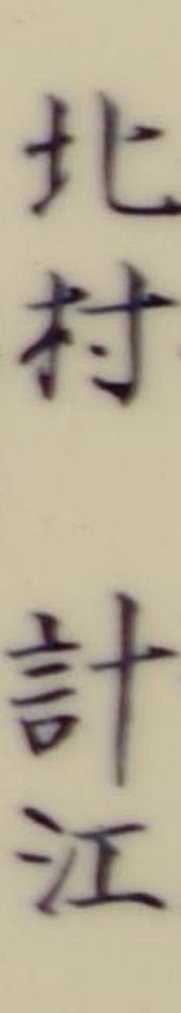北村計江
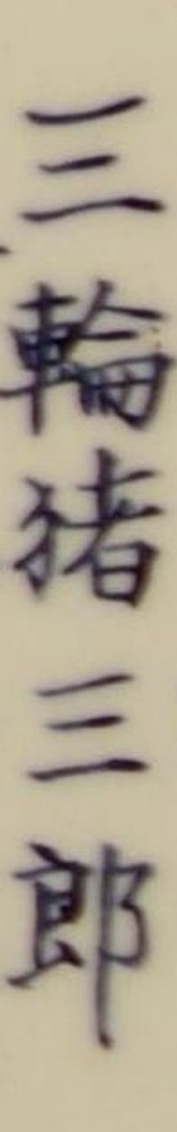三輪猪三郎
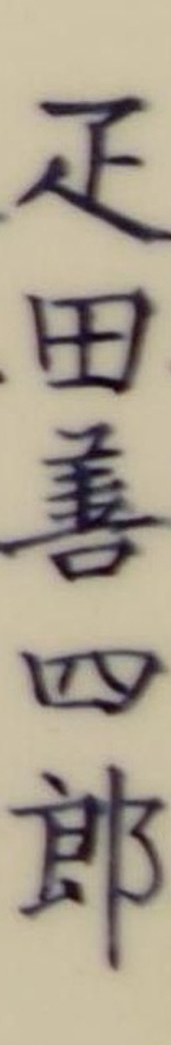疋田善四郎
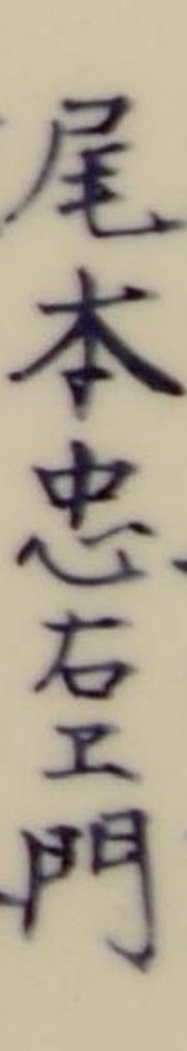尾本忠右ヱ門
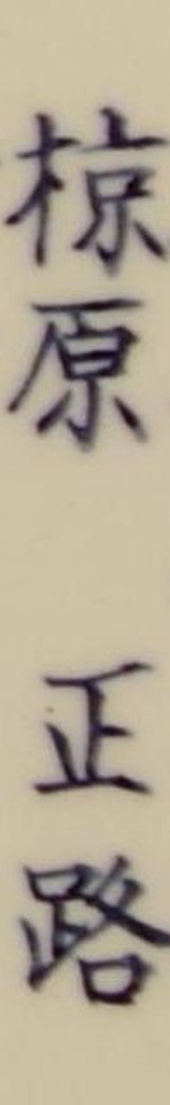椋原正路
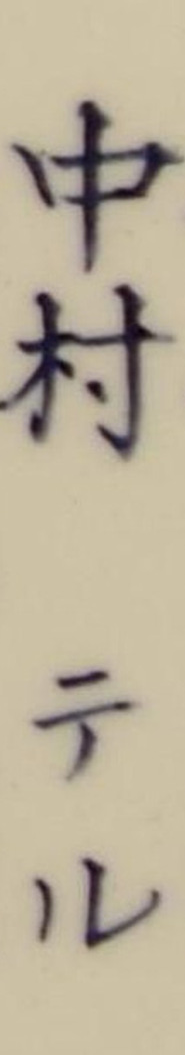中村テル
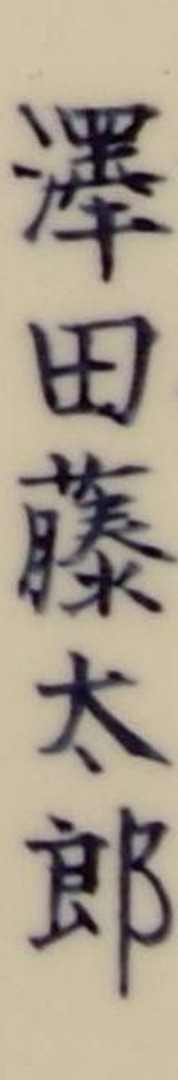澤田藤太郎
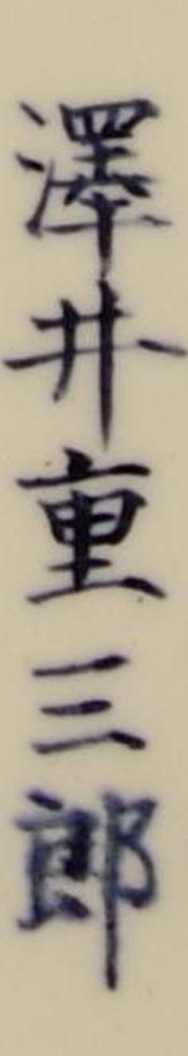澤井重三郎
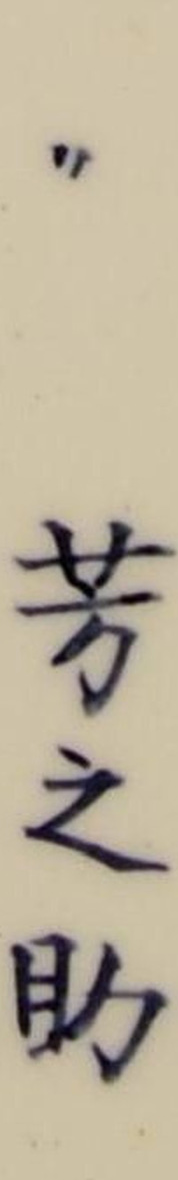芳之助
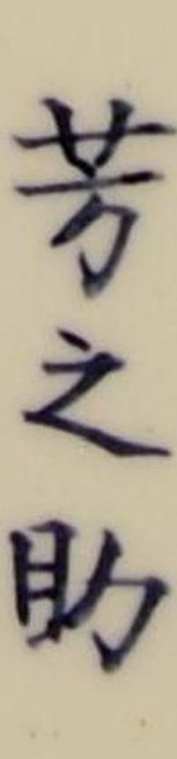芳之助
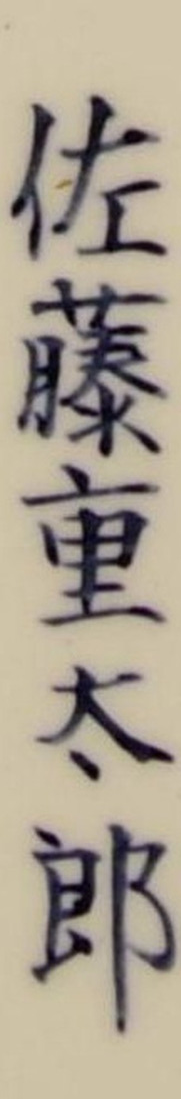佐藤重太郎
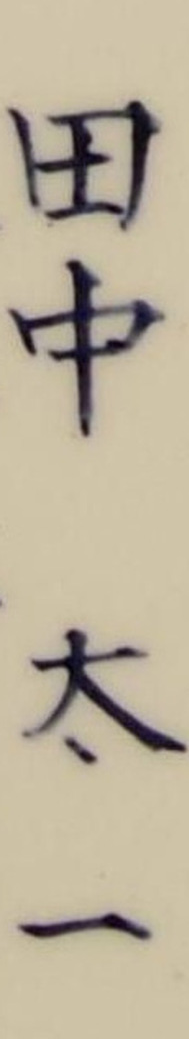田中太一
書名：E~L
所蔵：高野山金剛峯寺
